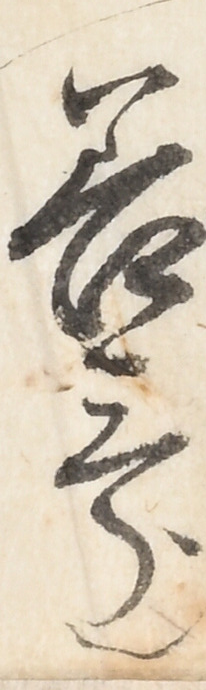善三郎

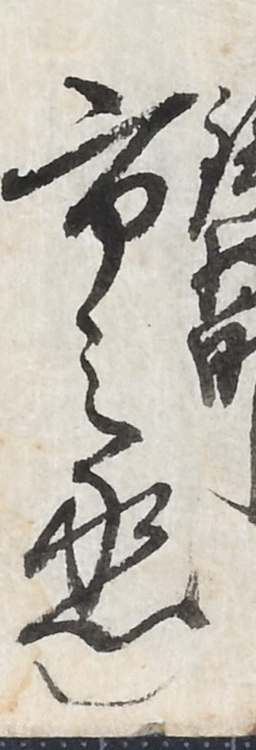市之丞
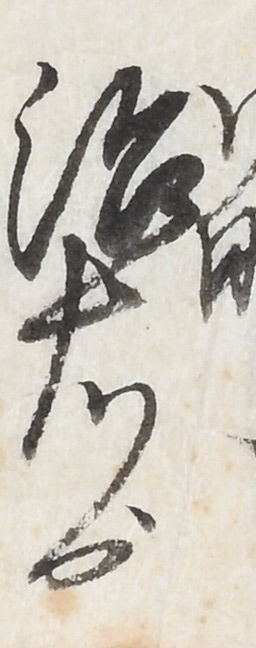治右衛門
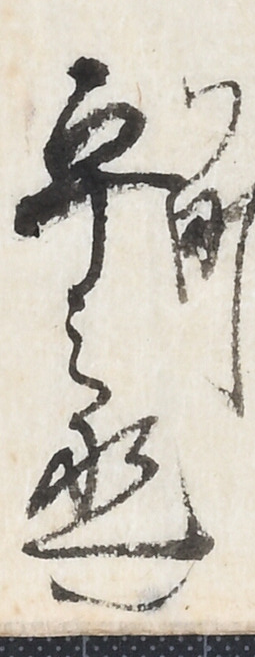市之丞
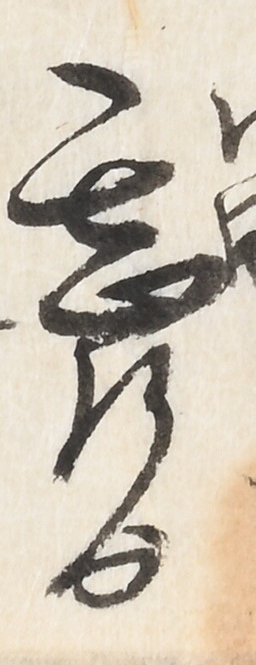甚左衛門
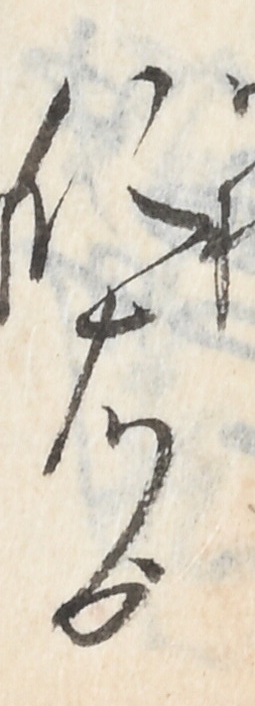治右衛門

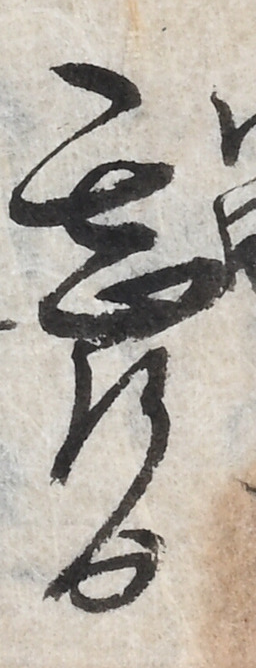杢左衛門
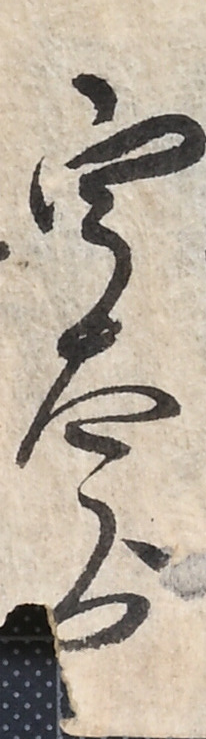作右衛門
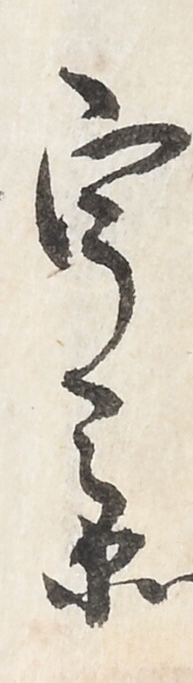宇兵衛
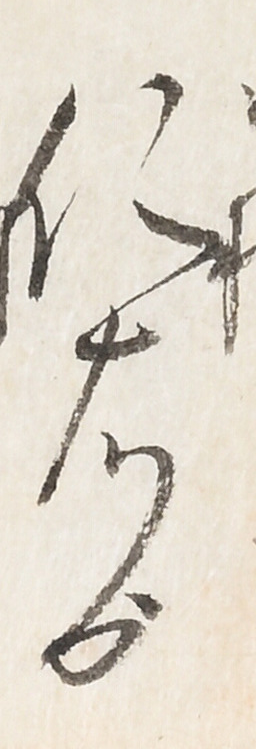作右衛門
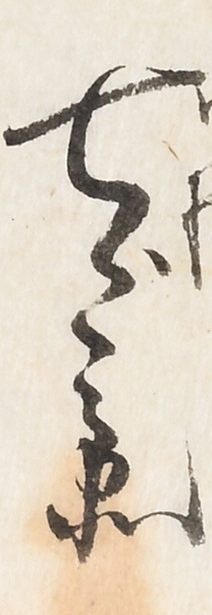七郎兵衛
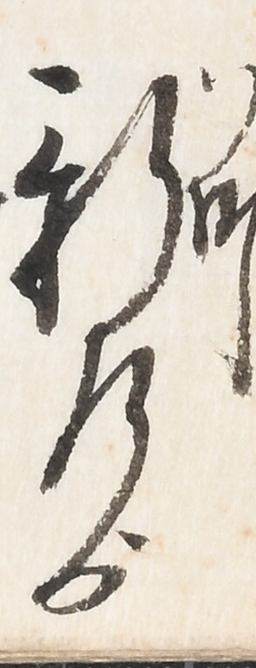新左衛門
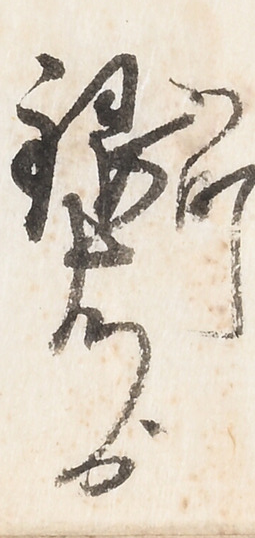銀右衛門
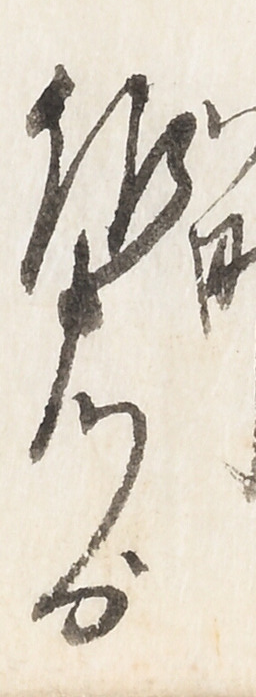作右衛門
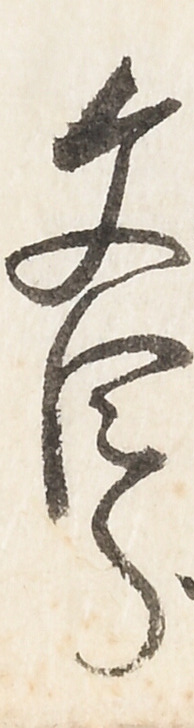文四郎
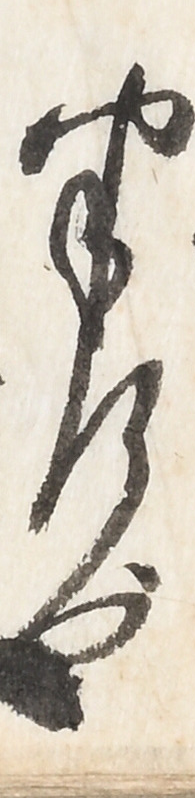杢左衛門
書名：合力覚帳
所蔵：伊那市立高遠町図書館・合同会社AMANE
